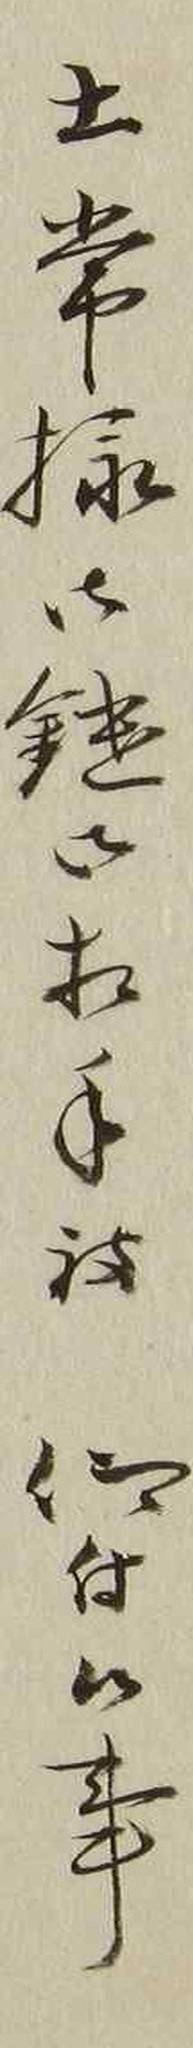土常様御鑓御相手被仰付候事
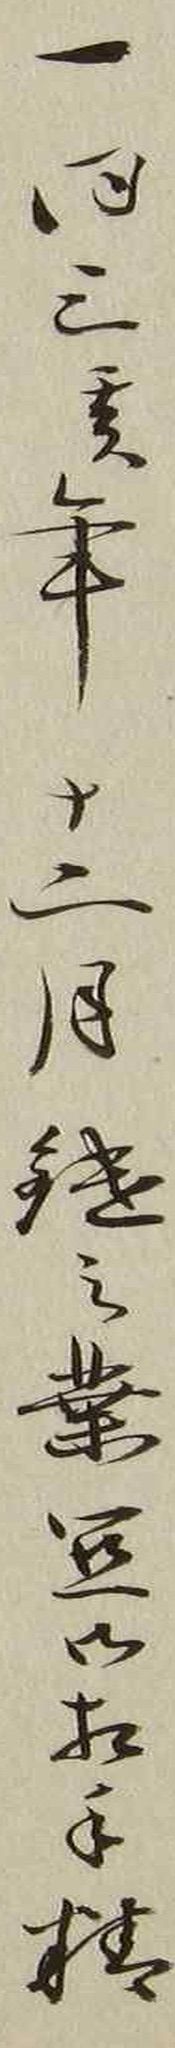一同三亥年十二月鑓之業宜御相手精
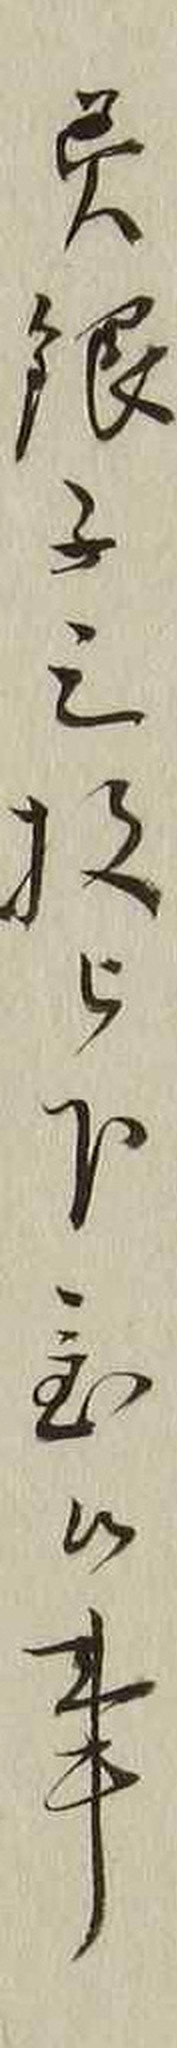美銀子三枚被下置候事
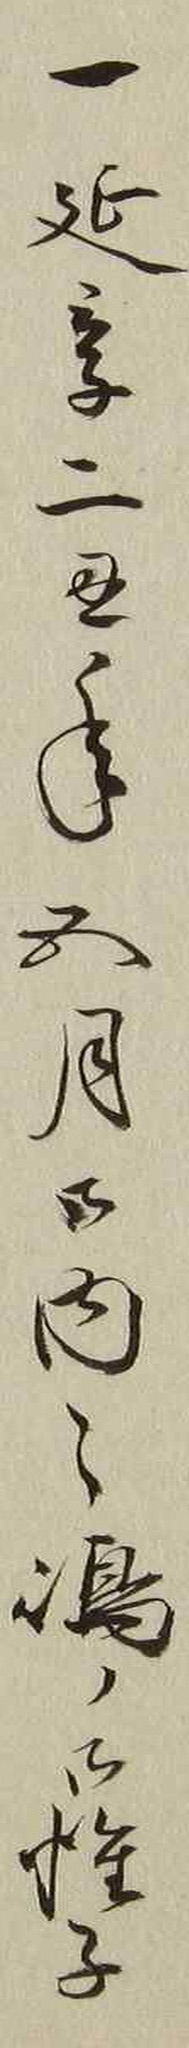一延享二丑年五月御内々嶋の御帷子
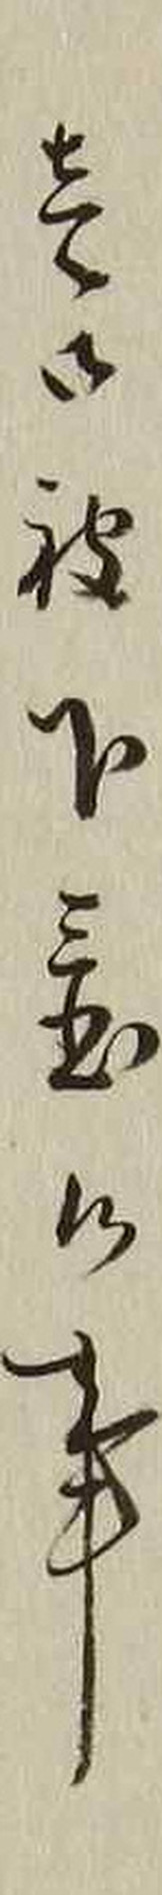壱御被下置候事
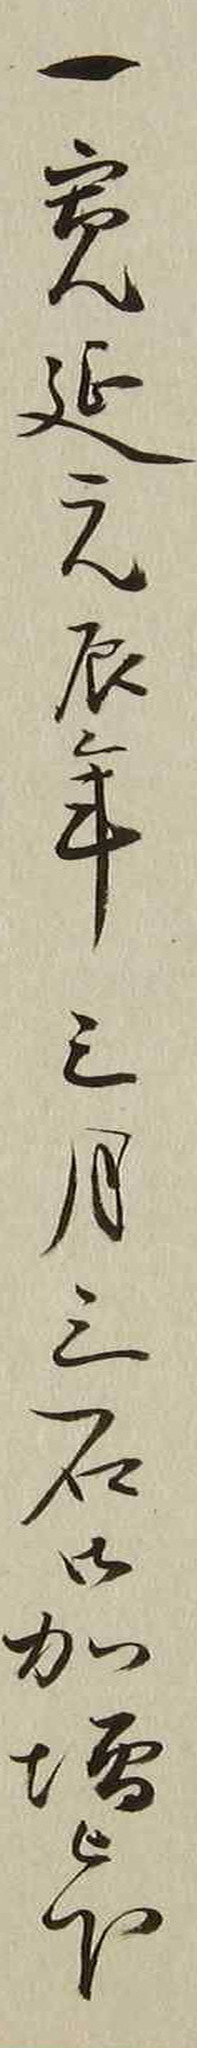一寛延元辰年三月三石御加増被下
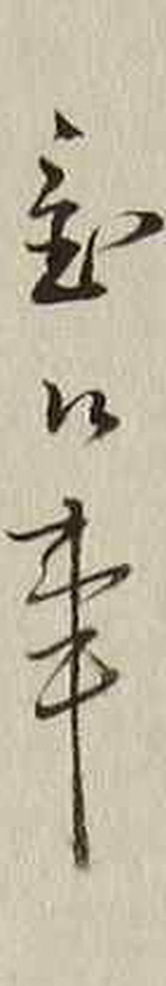置候事
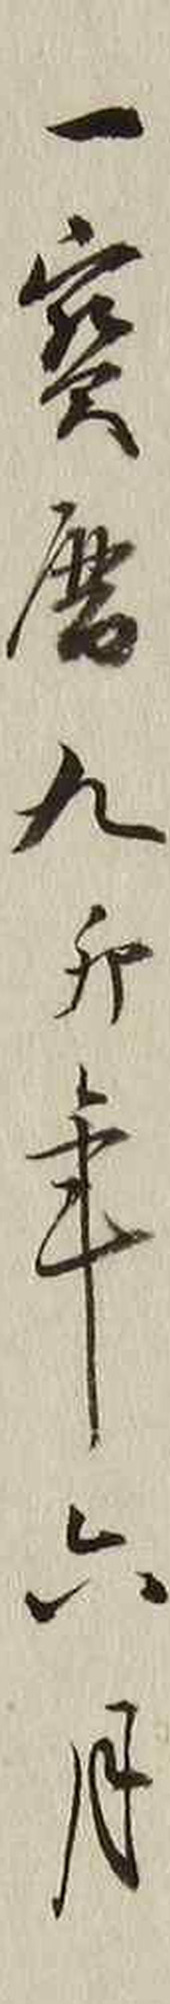一宝暦九卯年六月
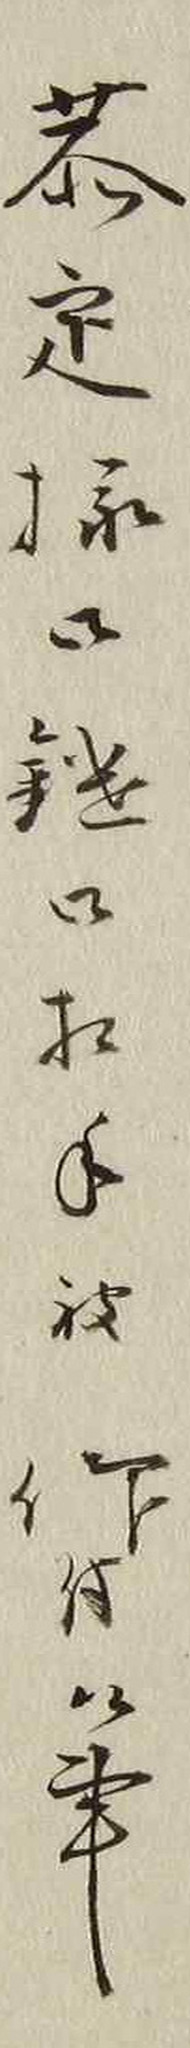恭定様御鑓御相手被仰付候事
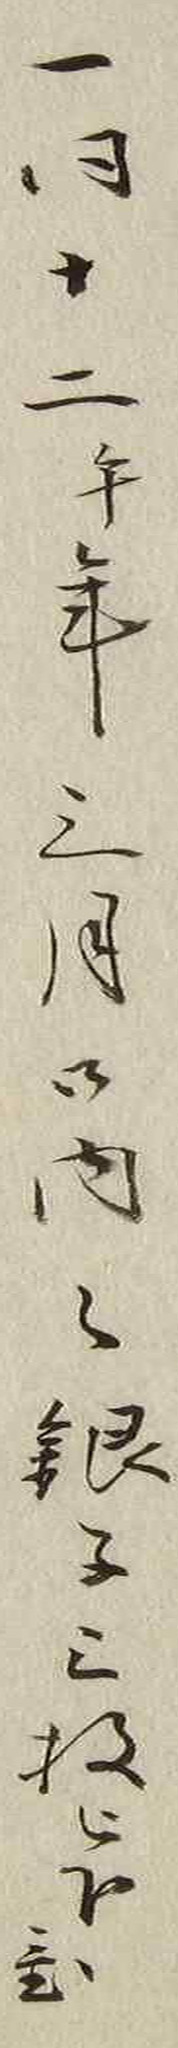一同十二午年三月御内々銀子三枚被下置
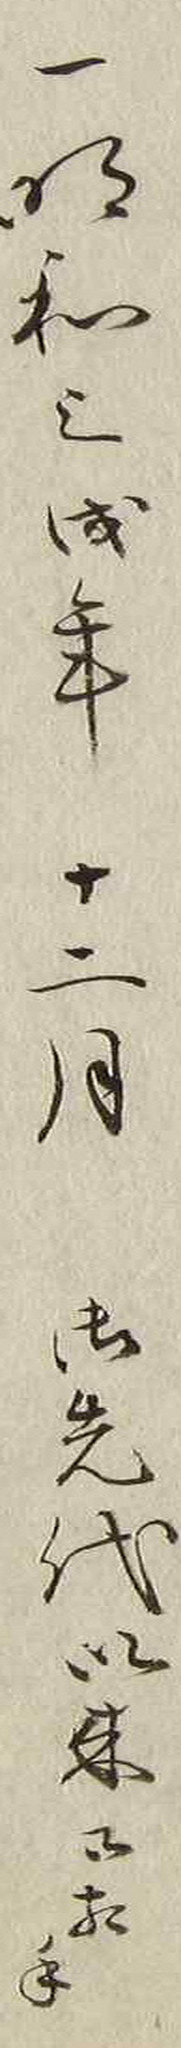一明和三戌年十二月御先代以来御相手
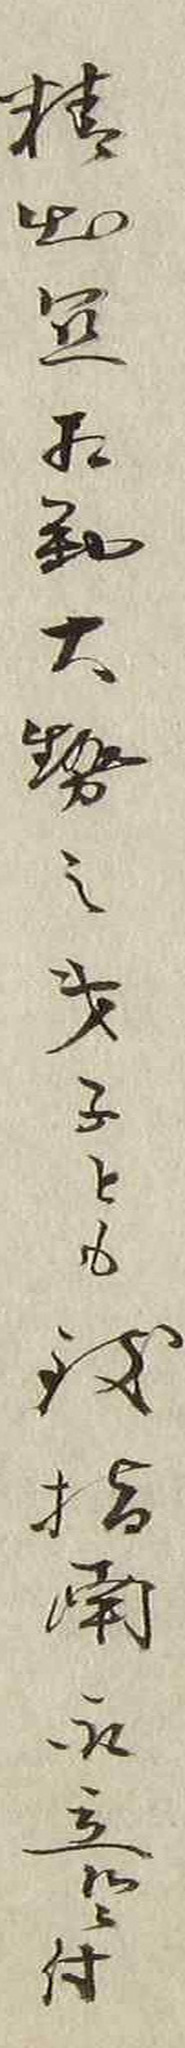精出宜相勤大勢之弟子とも致指南取立候に付
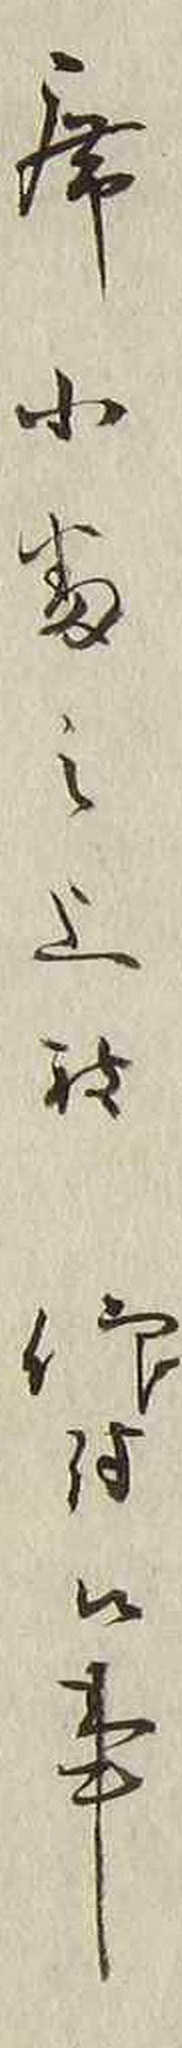席小番之上被仰付候事
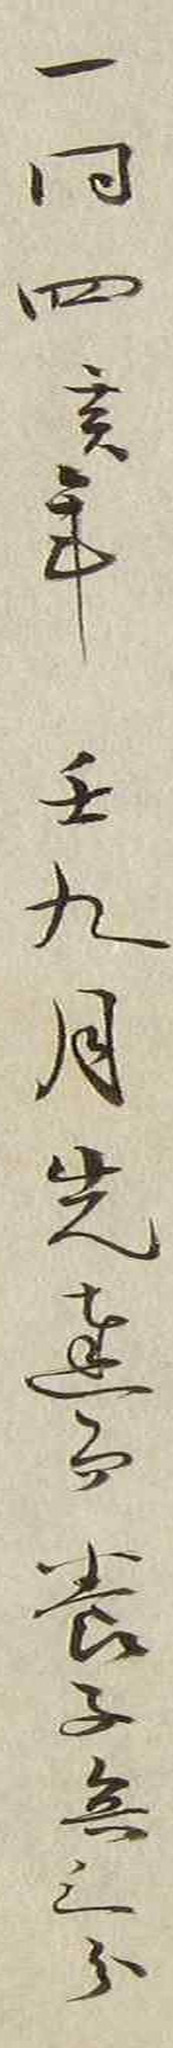一同四亥年壬九月先達而養子兵三郎
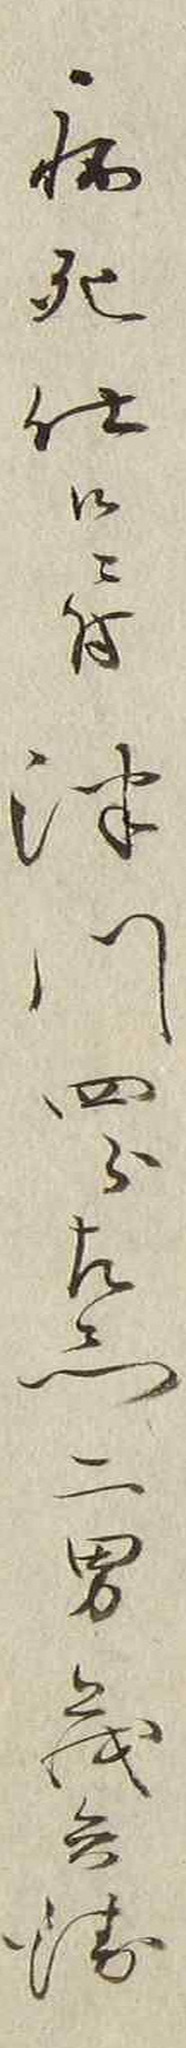病死仕候に付津川四郎左衛門二男茂兵衛

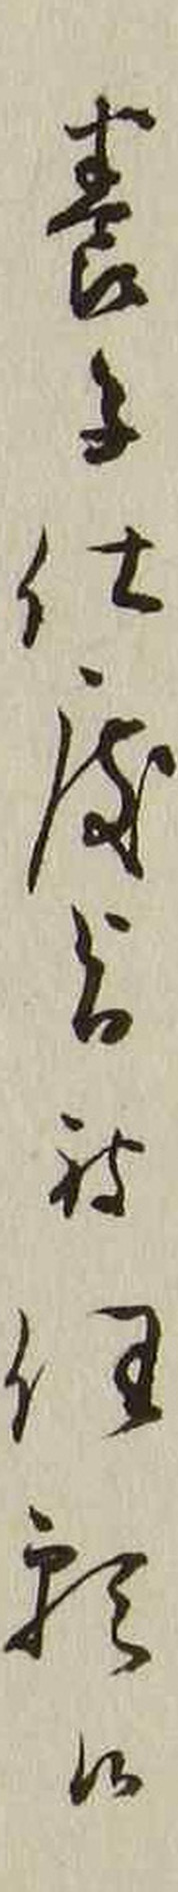養子仕度旨被任願候
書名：諸士系譜　巻之157　ね之部1
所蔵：会津若松市立会津図書館
